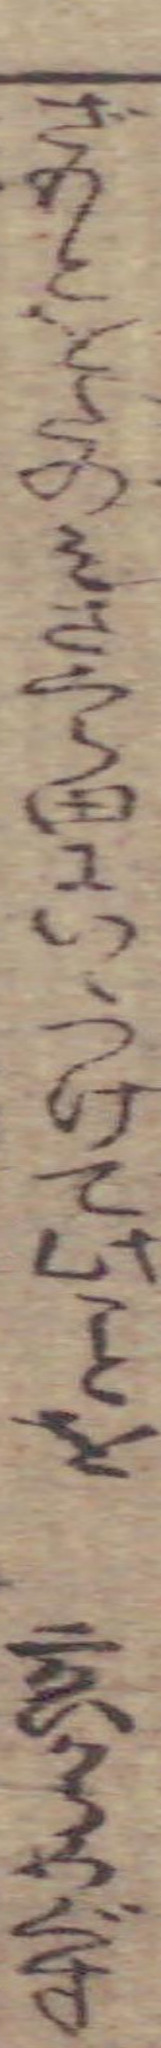ざもとをたのみさくら田にいゝつけて此ことを
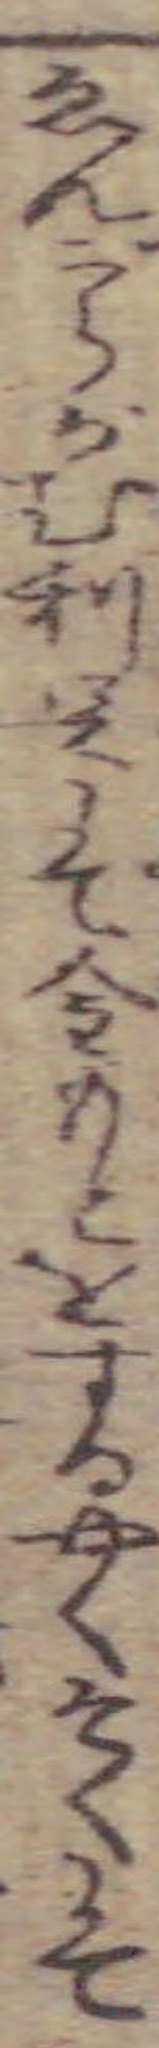ゑん二郎がむ利足にて金もとをするやくそくにて
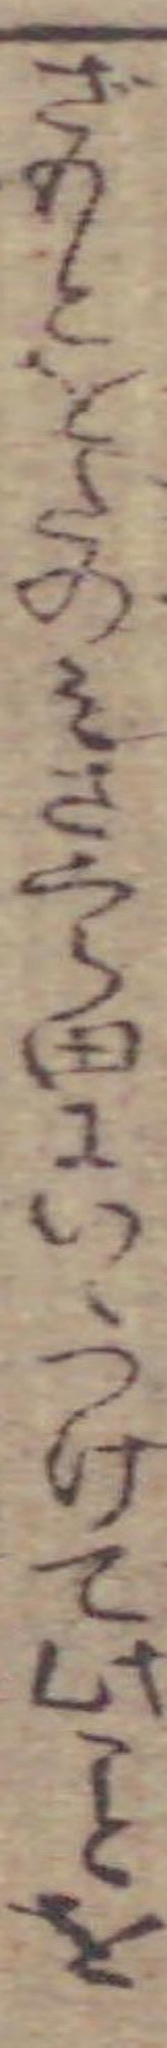ざもとをたのみさくら田にいゝつけて此ことを
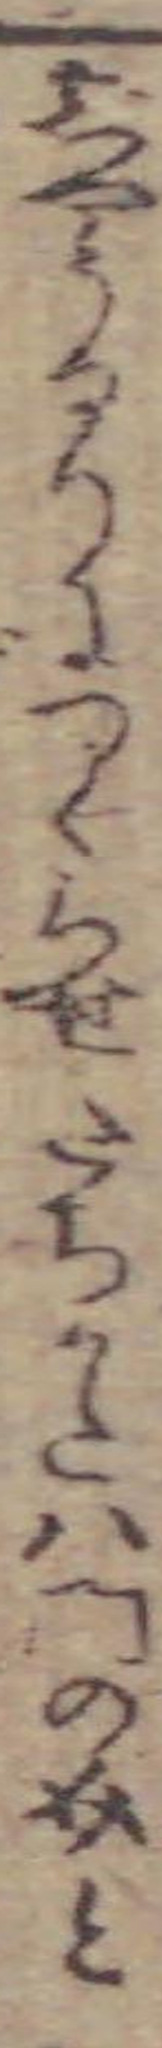じやうるりにつくらせたちかたは門の介と
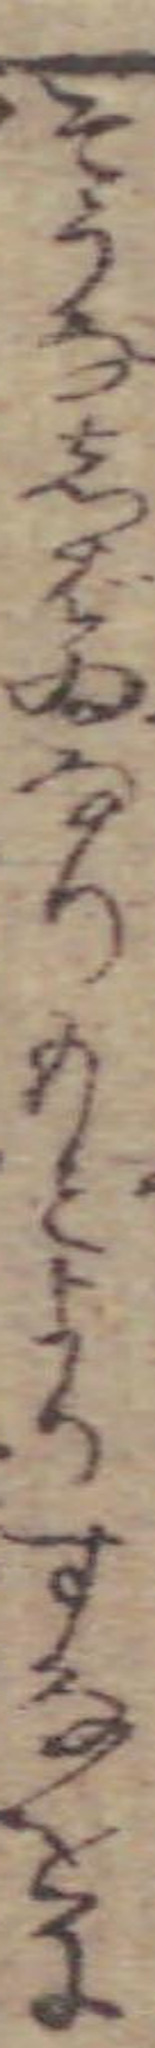そうなしばゐなりもとよりすなをに
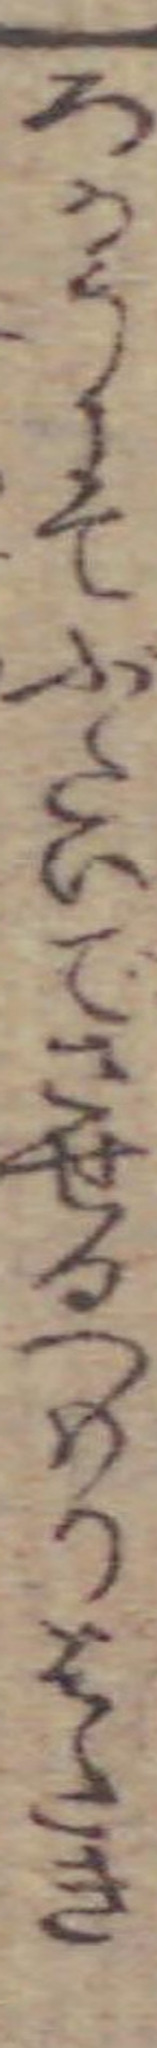ろかうにてぶたいでさせるつもりはたき
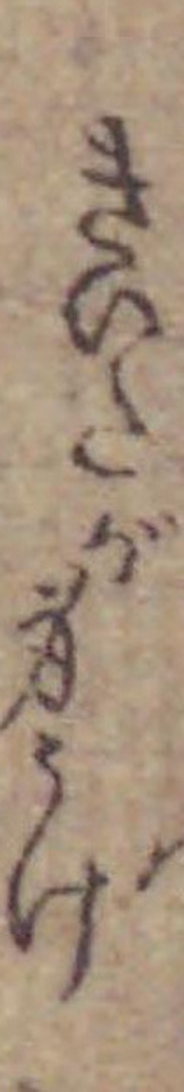きいたが身うけ
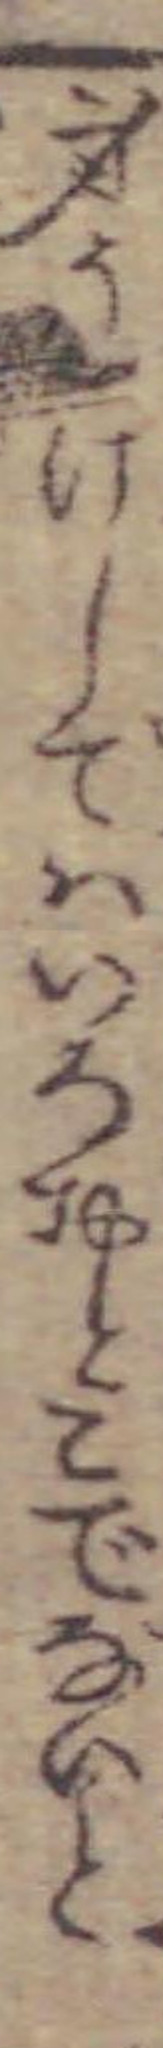身うけしてはいろおとこでないと
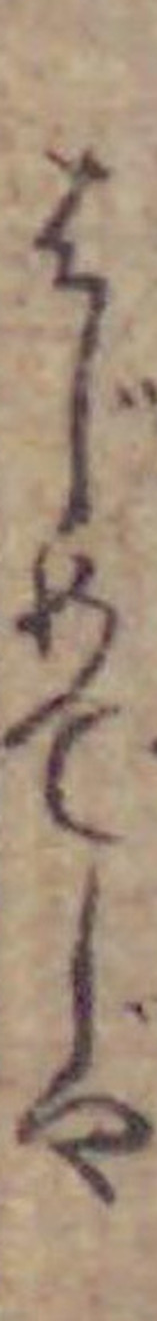はじめてじや
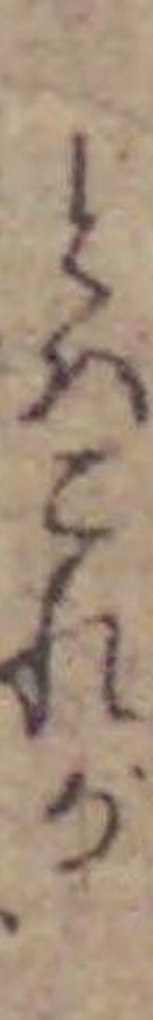とはこれが
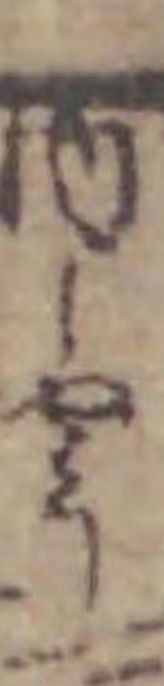内しやう
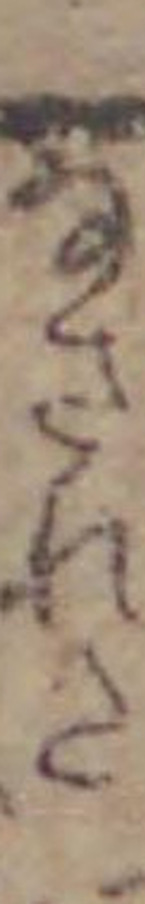なされた
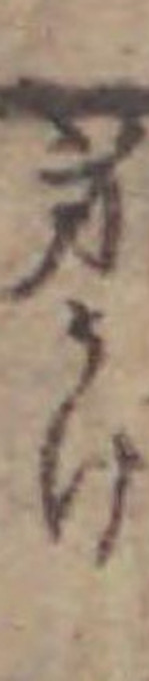身うけ
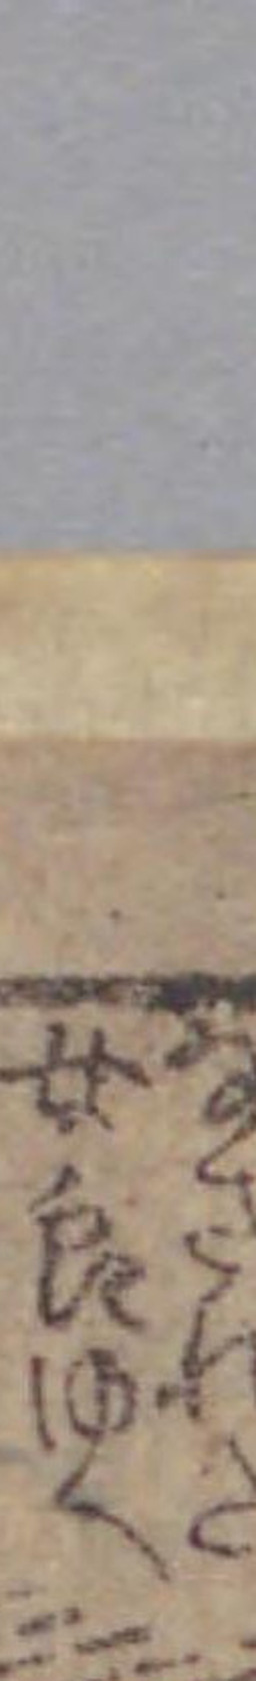女郎ゆへ
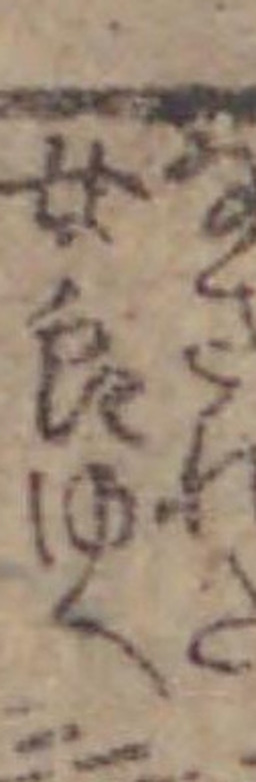女郎ゆへ
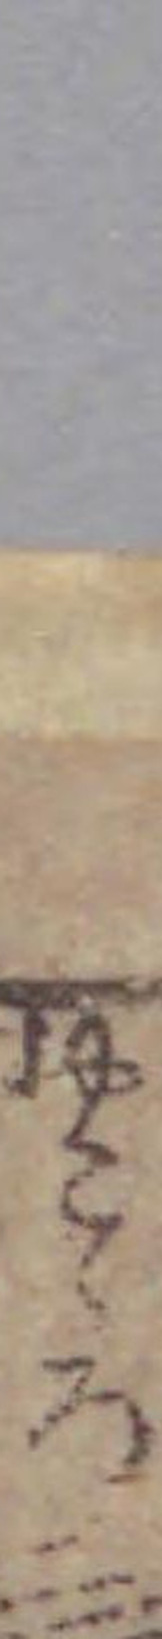おこゝろ
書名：江戸生艶気樺焼 : 3巻
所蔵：国立国会図書館 National Diet Library, JAPAN
